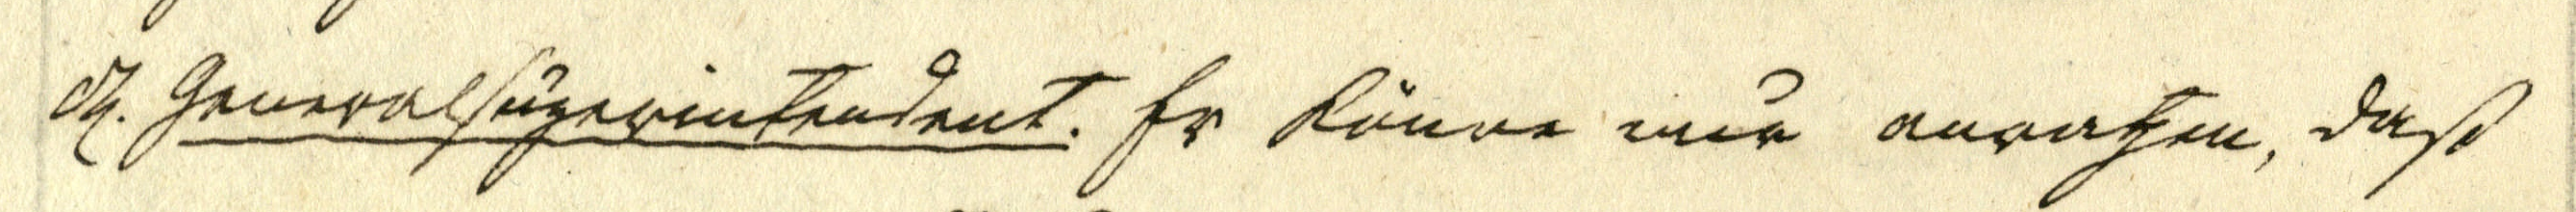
dh. Generalsuperintendent. Er könne nur anrathen, daß
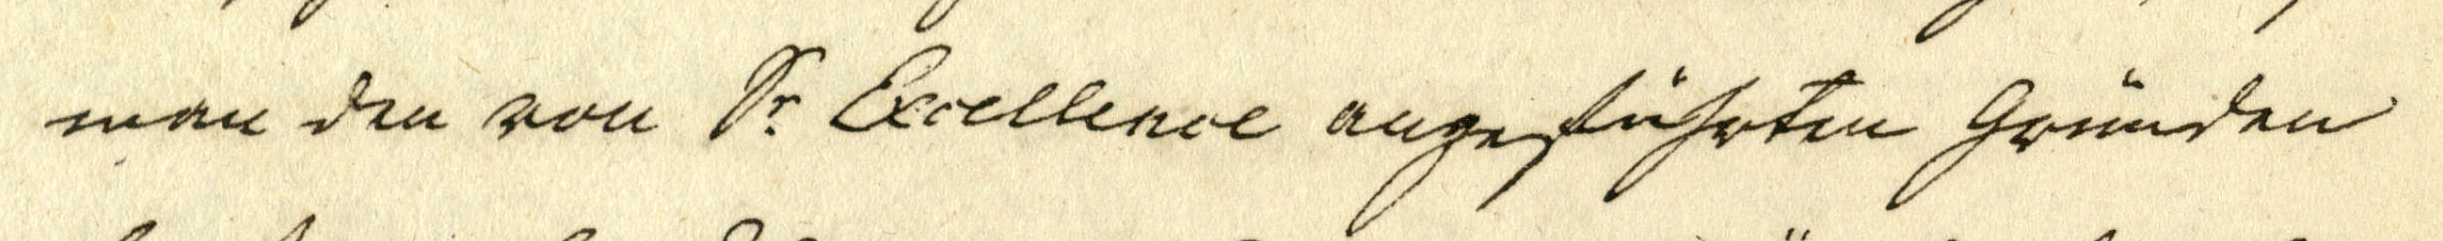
man den von Sr. Excellence angeführten Gründen
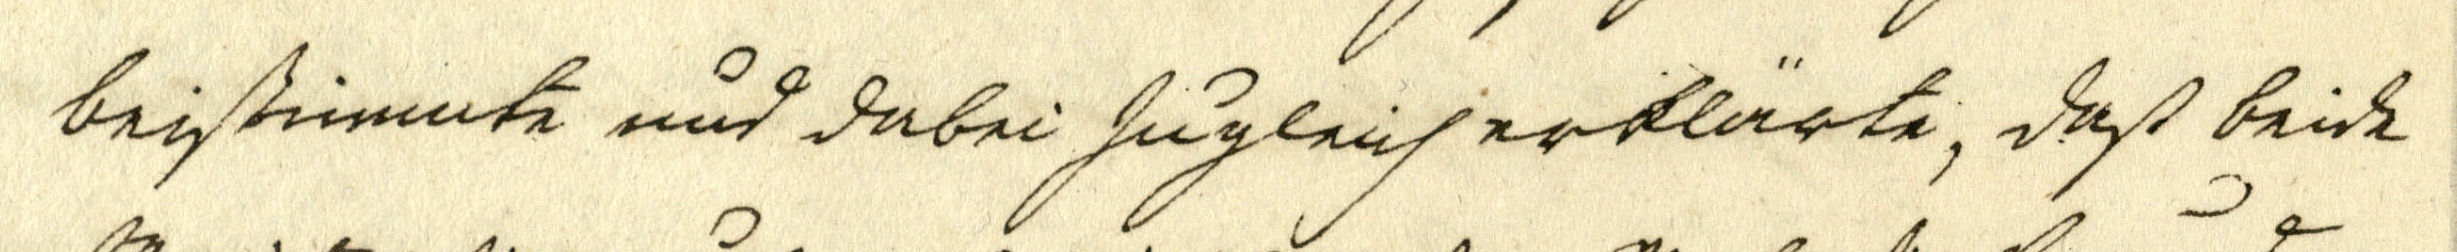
beistimmte und dabei zugleich erklärte, daß beide
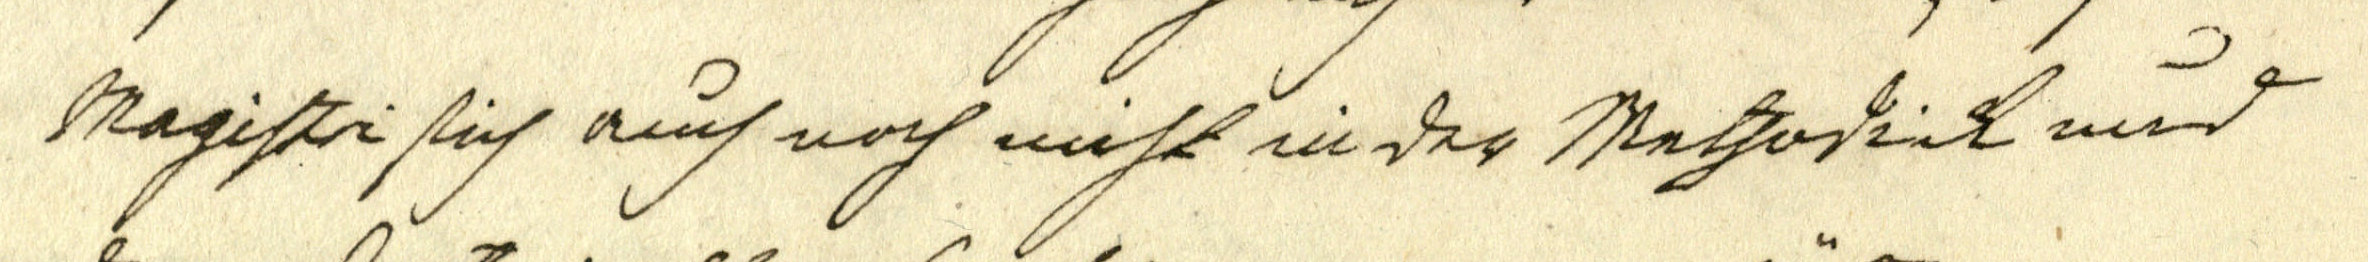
Magistri sich auch noch nicht in der Methodick und
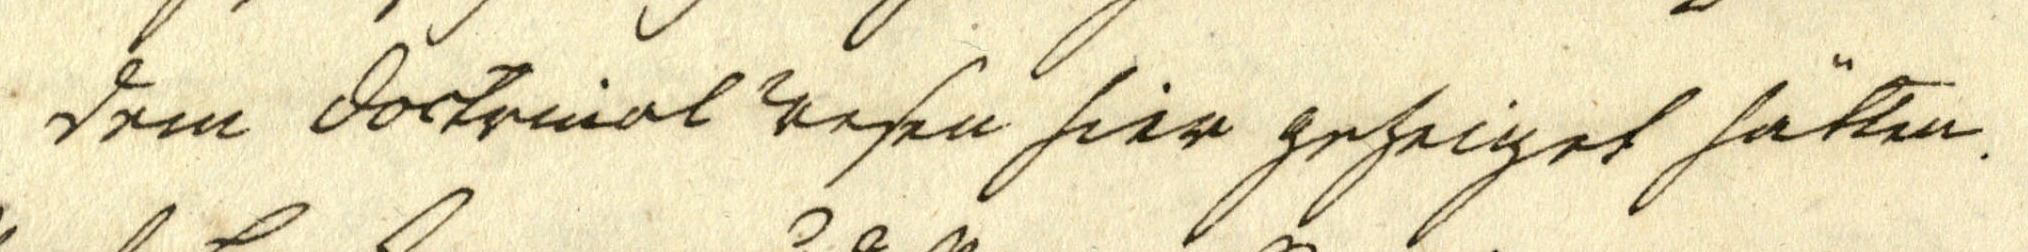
dem Doctrinal Wesen hier gezeiget hätten.
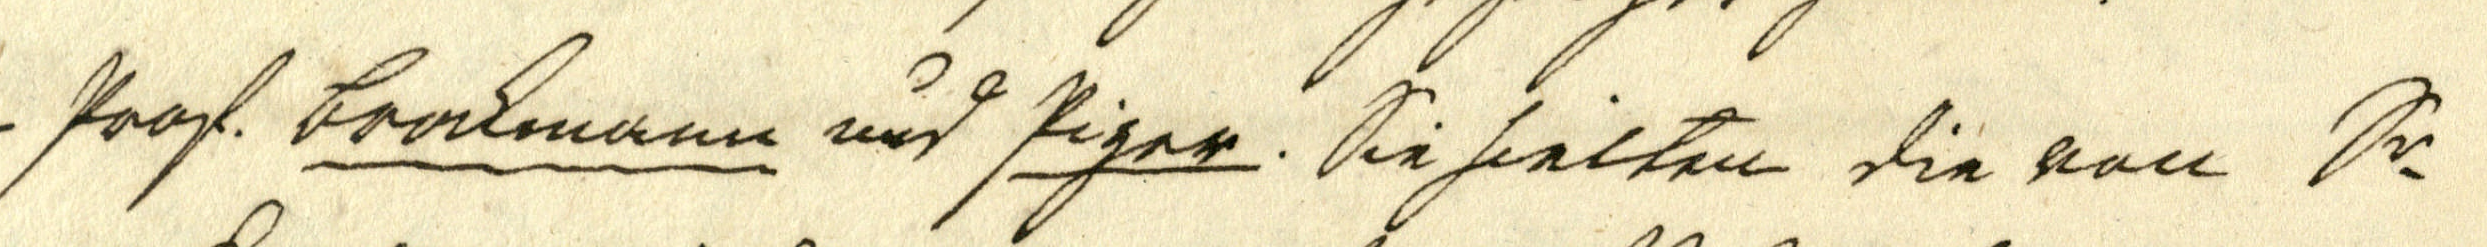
Prof. Brockmann und Piper. Sie hielten die von Sr.
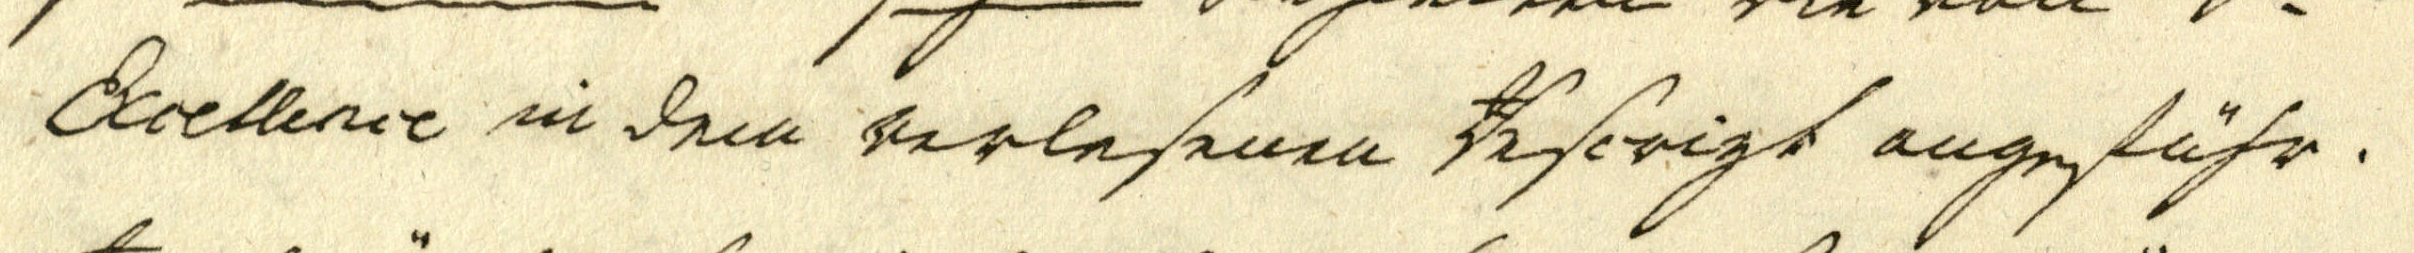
Excellence in dem verlesenen Rescript angeführ¬
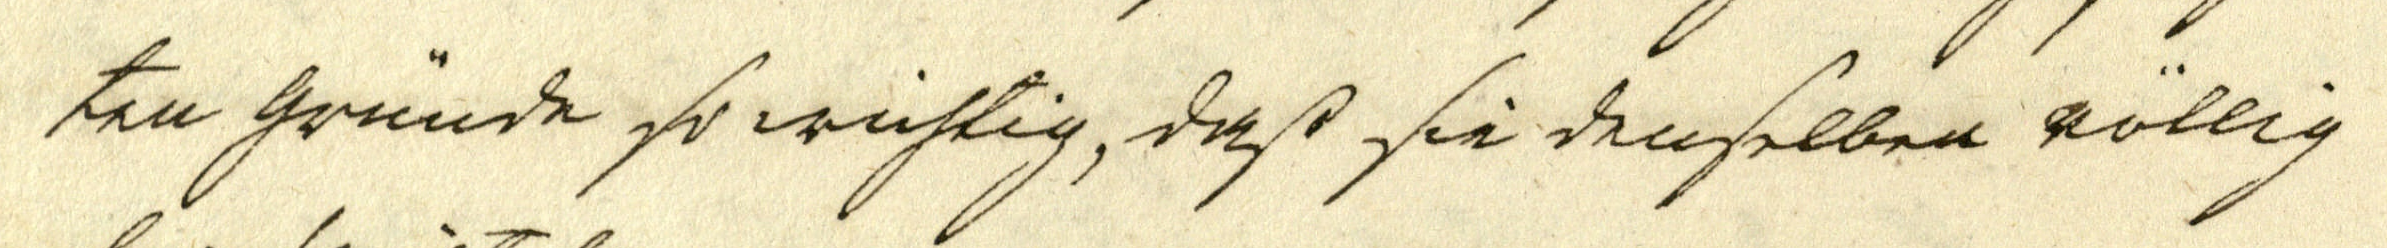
ten Gründe so wichtig, daß sie denselben völlig
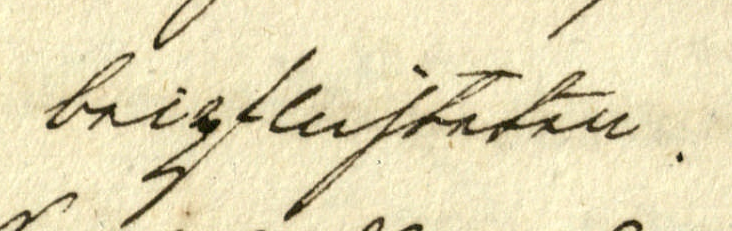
beipflichteten.
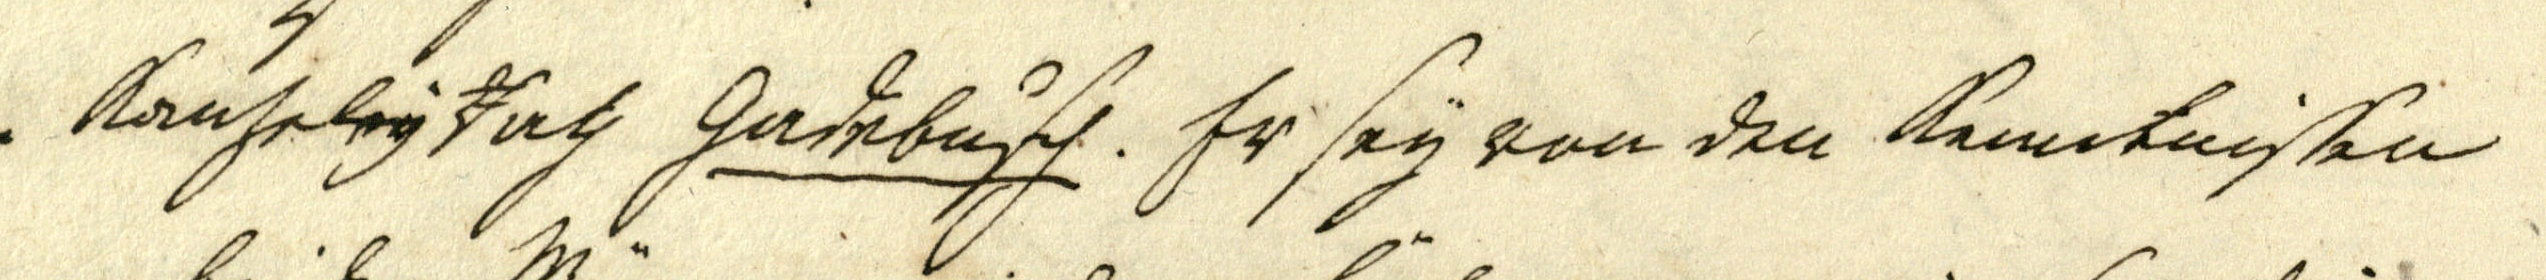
Kanzeleÿ Rath Gadebusch. Er seÿ von den Kentnissen
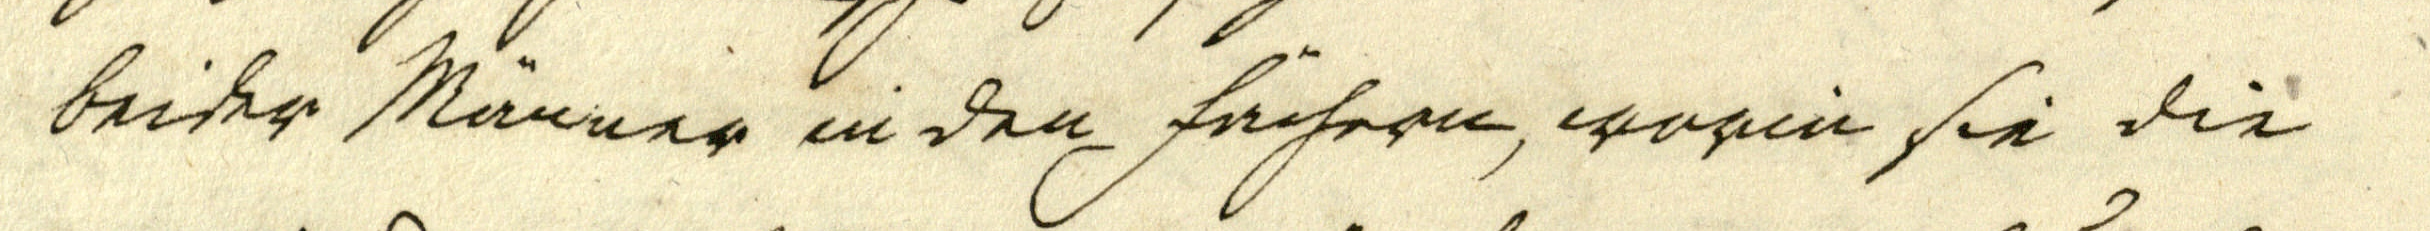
beider Männer in den Fächern, worin sie die
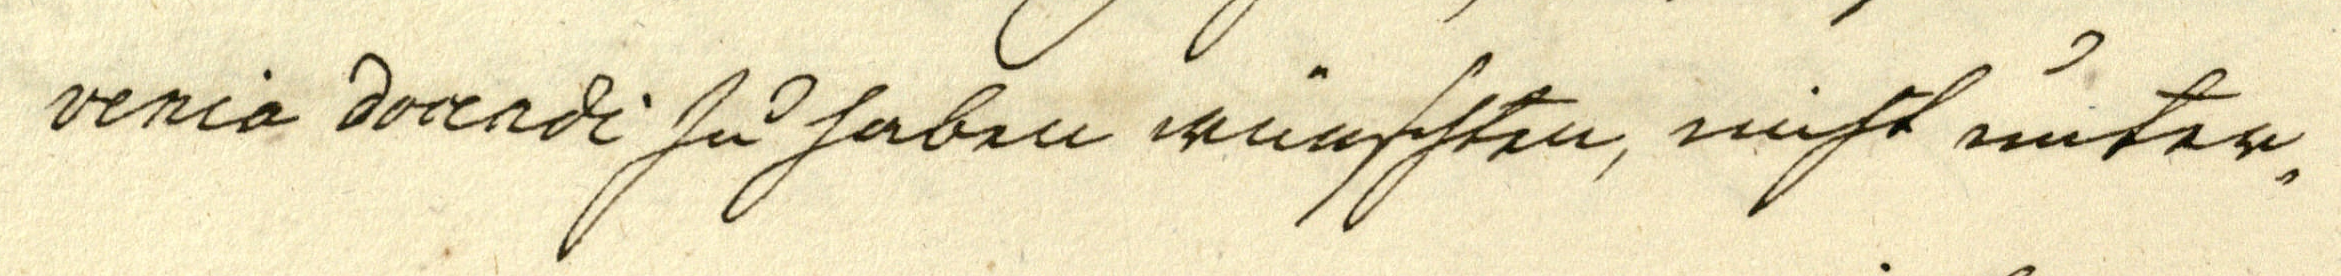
venia docendi zu haben wünschten, nicht unter¬
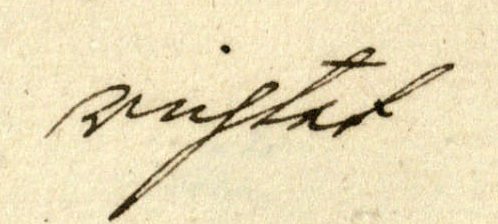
richtet
